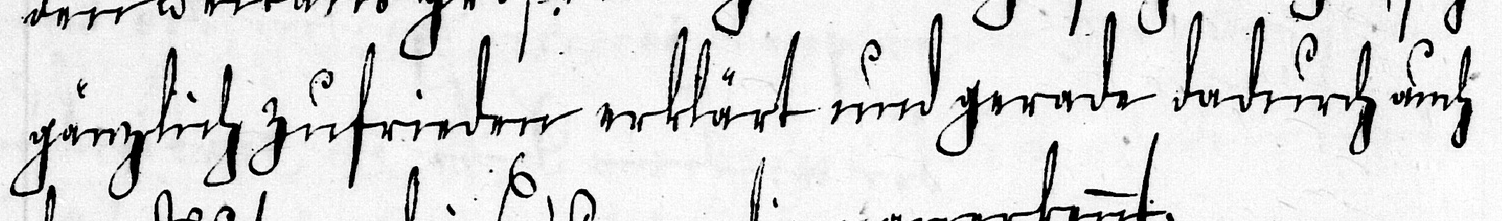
gänzlich zufrieden erklärt und gerade dadurch auch
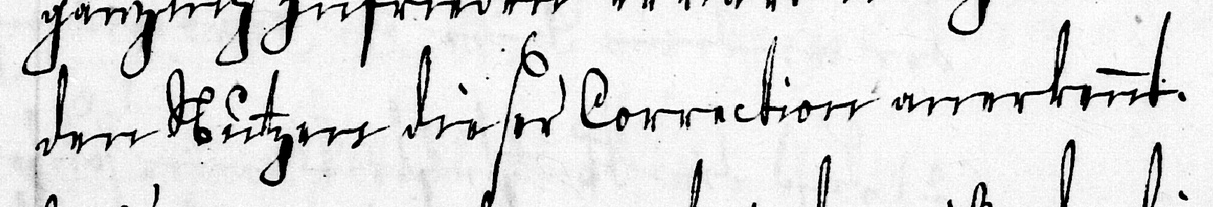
den Nutzen dieser Correction anerkennt.
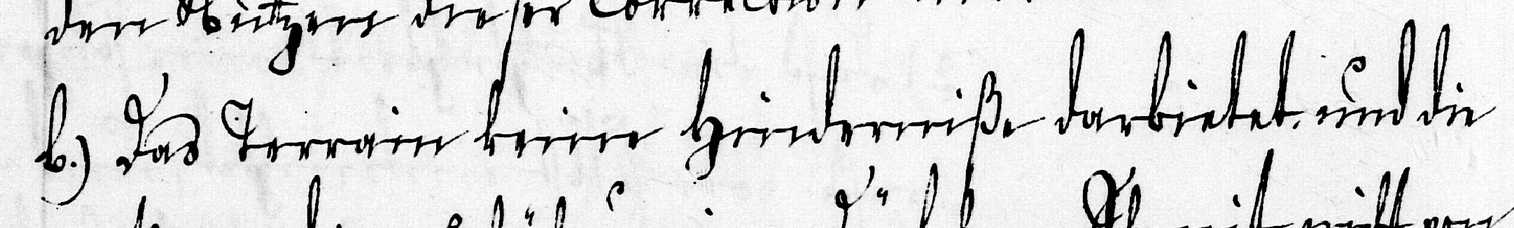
b.) Das Terrain keine Hinderniße darbietet und die
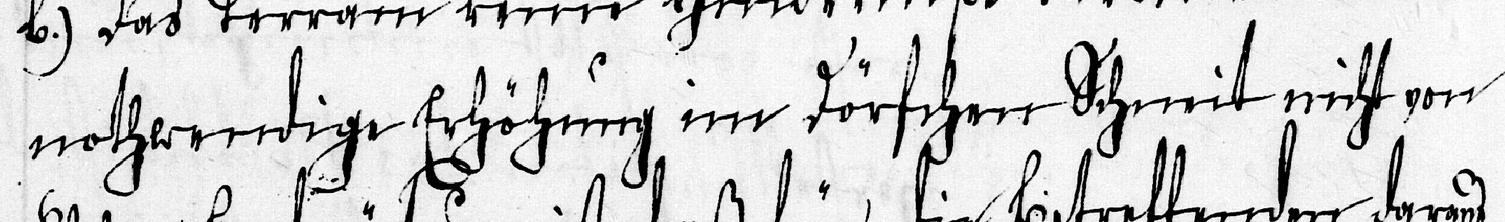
nothwendige Erhöhung im Dörfchen Schneit nicht von
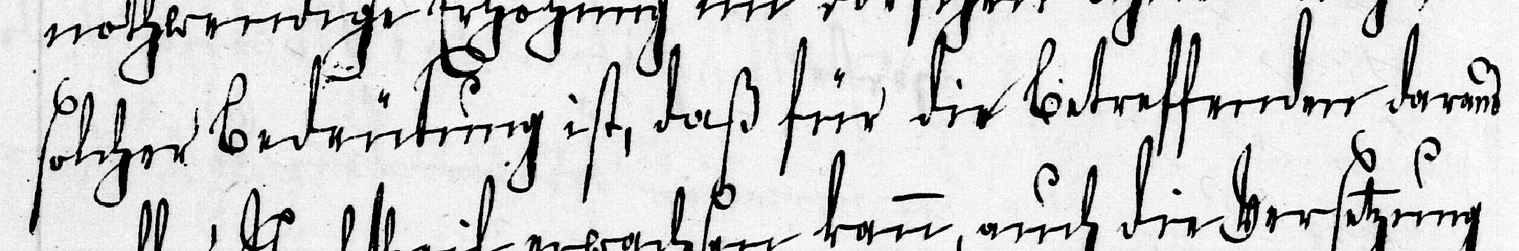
solcher Bedeutung ist, daß für die Betreffenden daraus
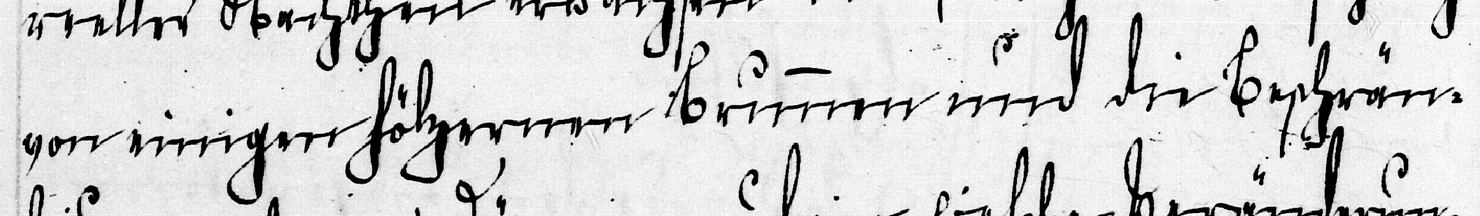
von einigen hölzernen Brunnen und die Beschrän¬
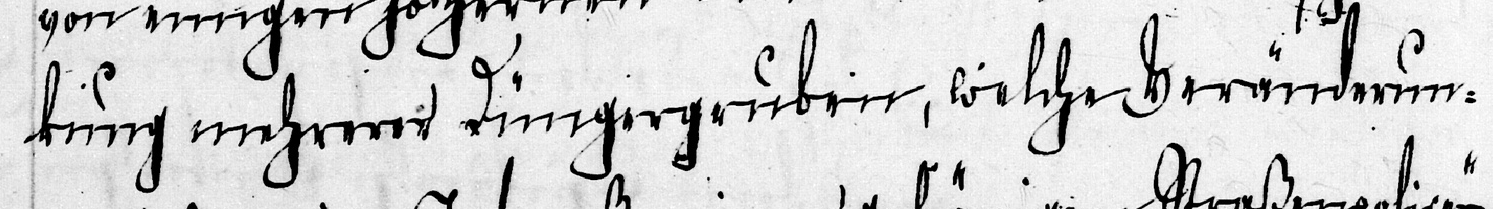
kung mehrerer Düngergruben, welche Veränderun¬
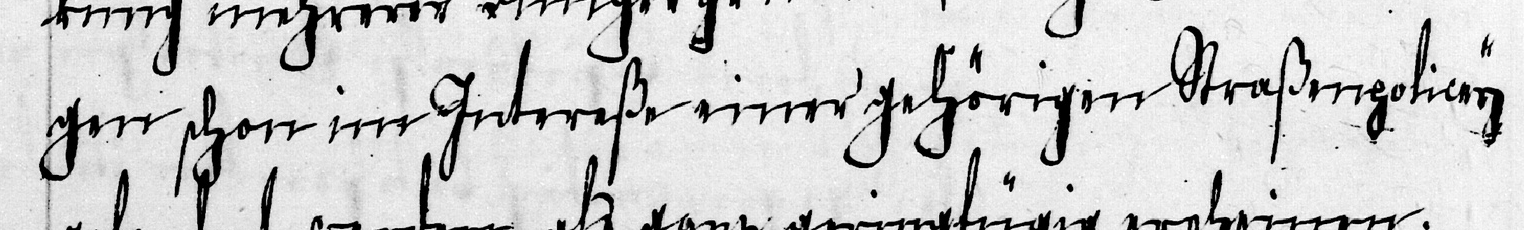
gen schon im Intereße einer gehörigen Straßenpolicey
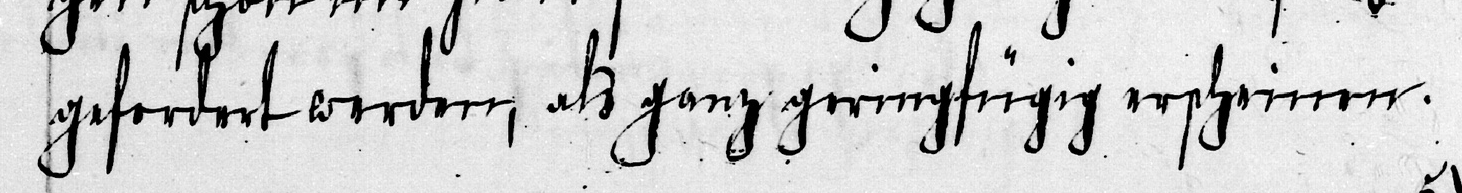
gefordert werden, als ganz geringfügig erscheinen.
